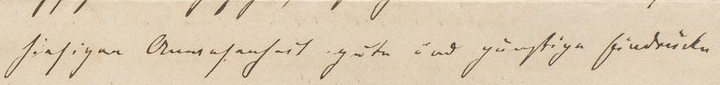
hiesigen Anwesenheit gute und günstige Eindrücke
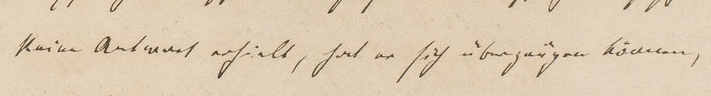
keine Antwort erhielt, hat er sich überzeugen können,
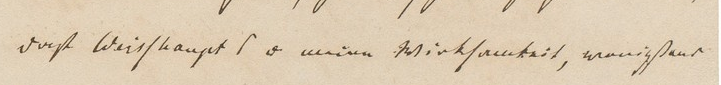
daß Weisshaupts u meine Wirksamkeit, wenigstens
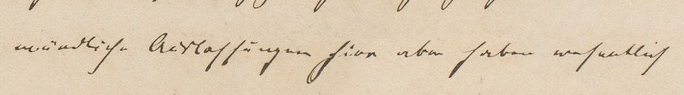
mündliche Auslassungen hier aber haben wesentlich
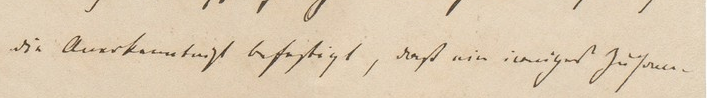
die Anerkenntniß befestigt, daß ein inniges Zusam-
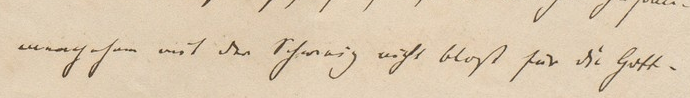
mengehen mit der Schweiz nicht bloß für die Gott-
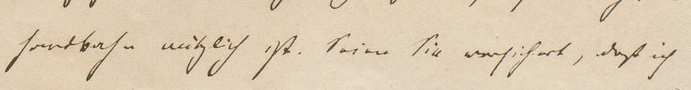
hardbahn nützlich ist. Seien Sie versichert, daß ich
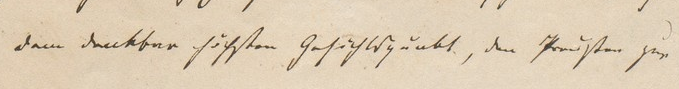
dem denkbar höchsten Gesichtspunkt, den Preußen zur
